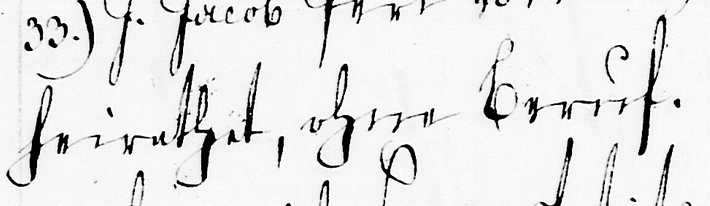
heirathet, ohne Beruf.
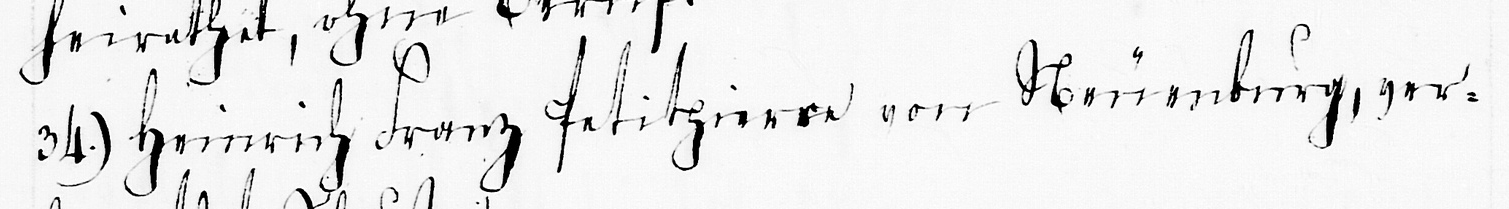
34.) Heinrich Franz Petitpierre von Neuenburg, ver¬
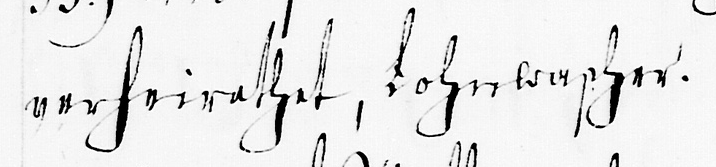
verheirathet, Lohnwascher.
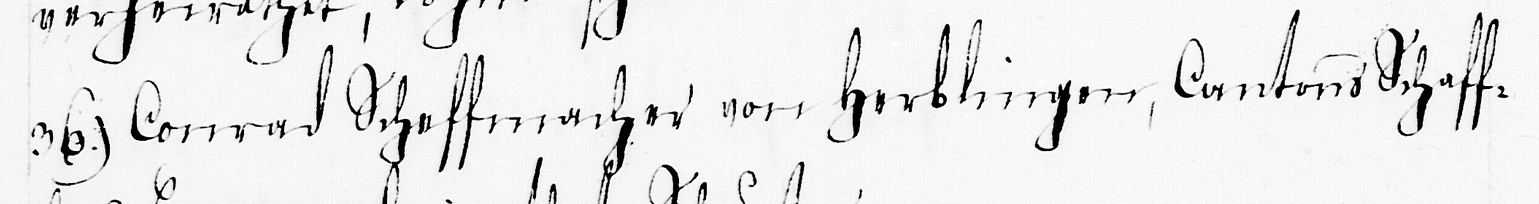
36.) Conrad Scheffmacher von Herblingen, Cantons Schaff¬
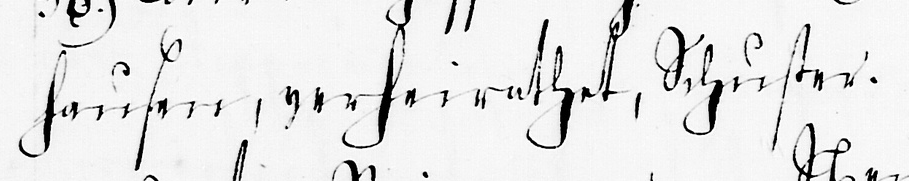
hausen, verheirathet, Schuster.
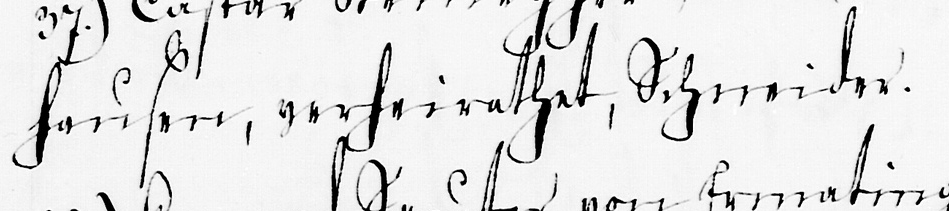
hausen, verheirathet, Schneider.
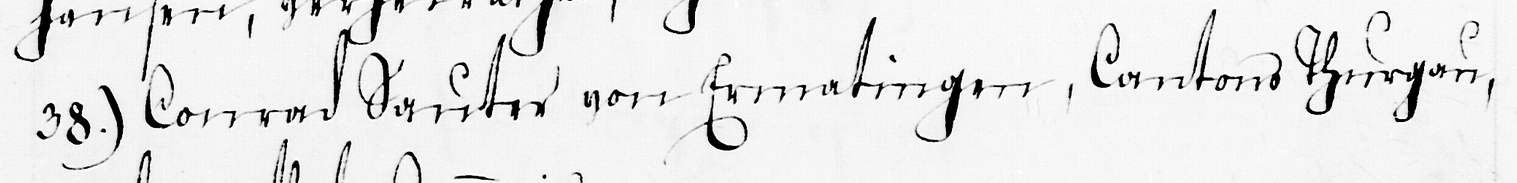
38.) Conrad Sauter von Ermatingen, Cantons Thurgau,
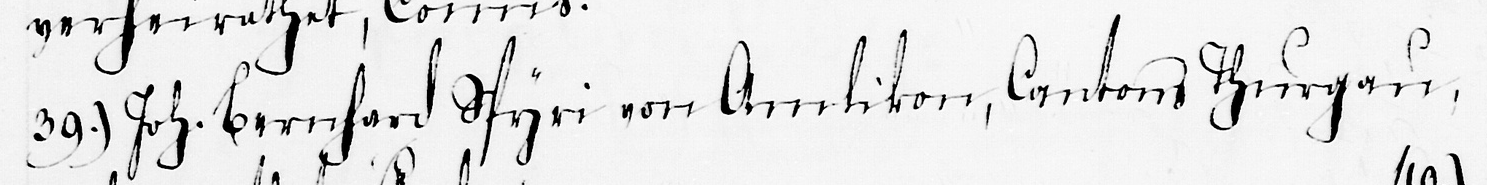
39.) Joh. Bernhard Spyri von Amlikon, Cantons Thurgau,
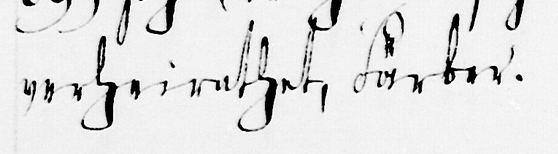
verheirathet, Färber.
